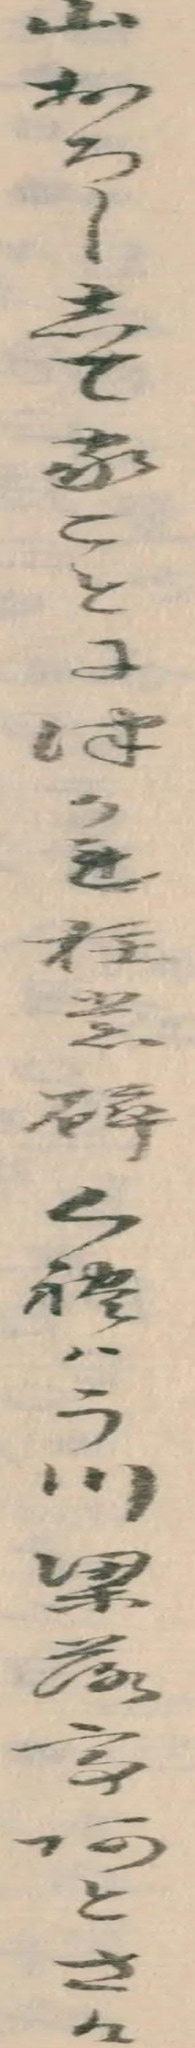山おろしして家ことにつかれ柱も砕くれはうつ梁落てあとさけ
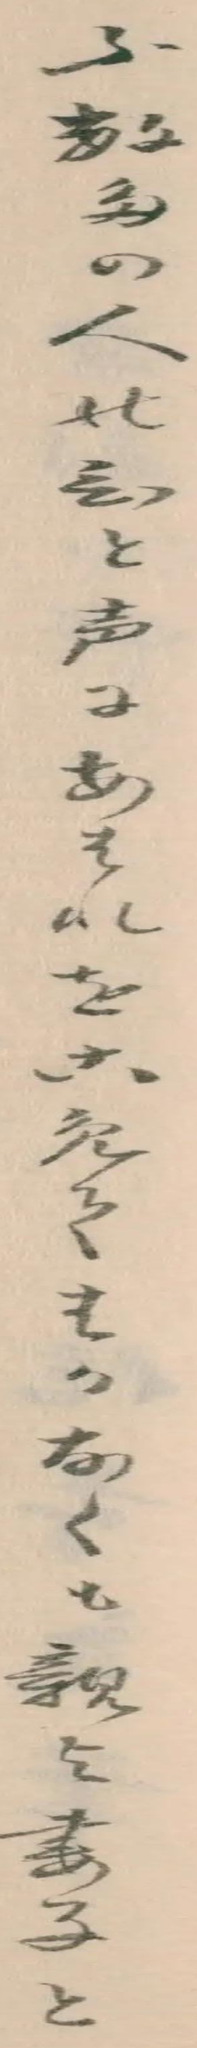ふ数多の人のひと声にあはれをこめてはかなくも親よ妻子と
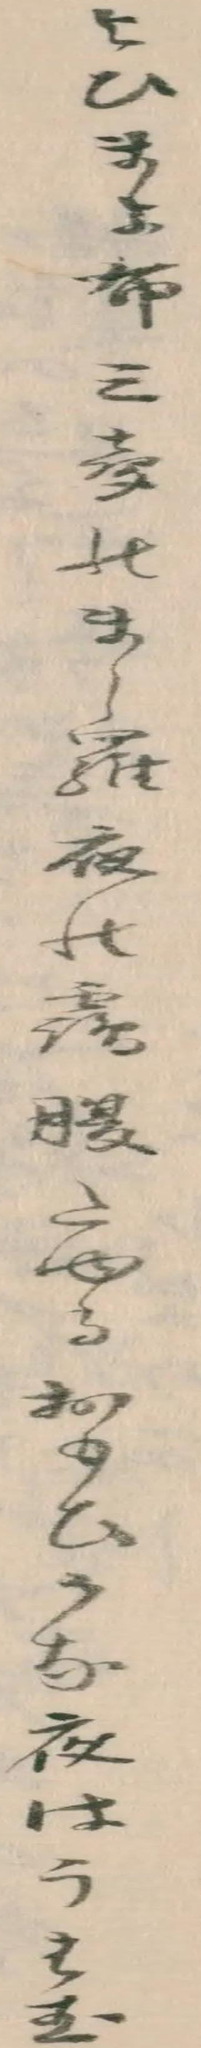よひまよふみせのましら夜の靄腹たゆるおもひかな夜はうは玉
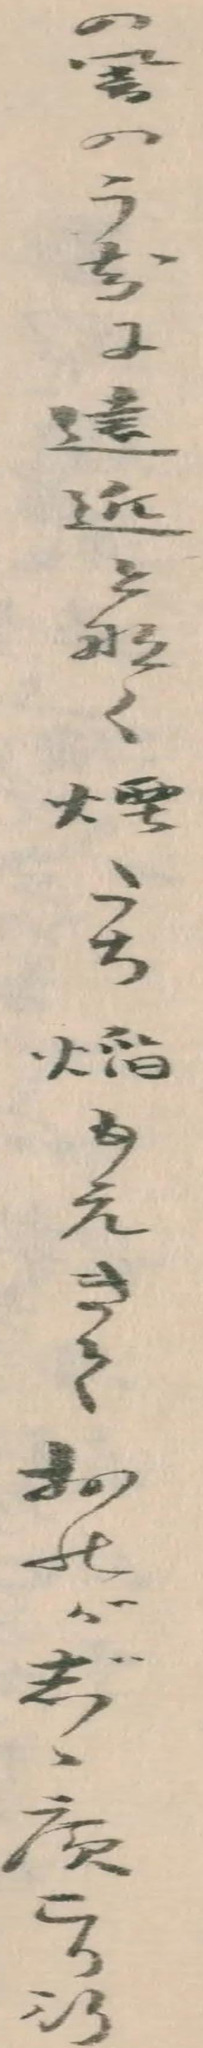の闇のうちに遠近となく煙たち焰もえきておのがじゝ広こり行
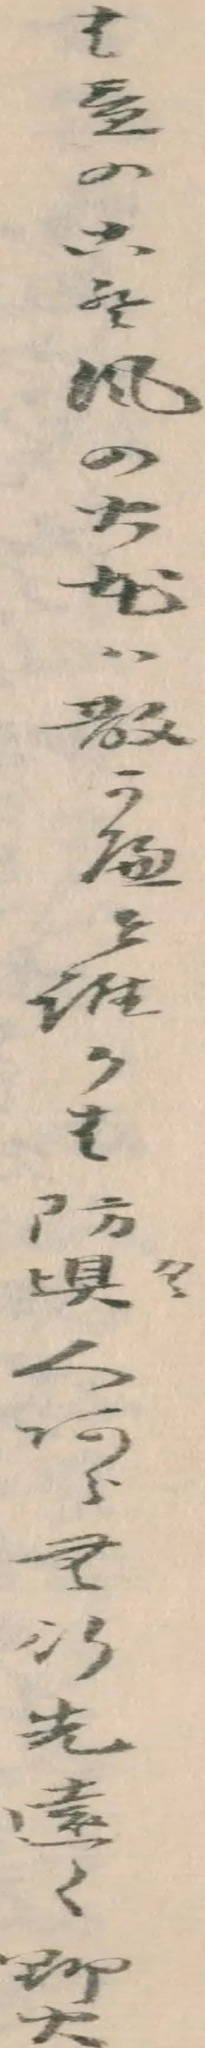は昼のこと風の火花は散かへと誰かは防く人あらむ行先遠く野火
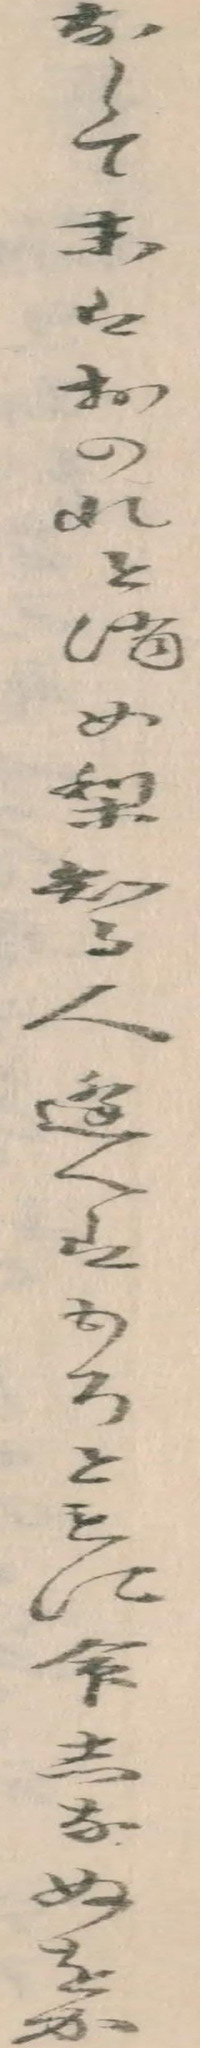なして末はおのれと消めり知る人逢へはもろともに命しなぬをか
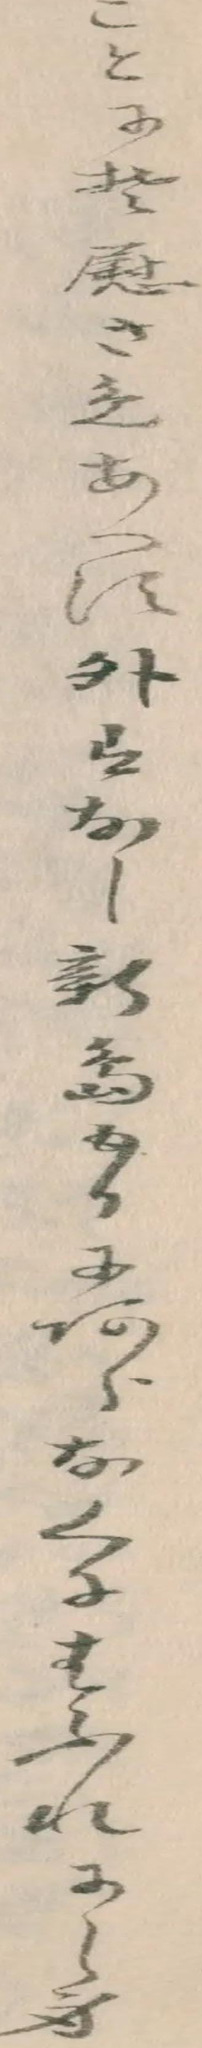ことにそ慰さめあへす外はなし新島もりにあらなくにはふれにし身
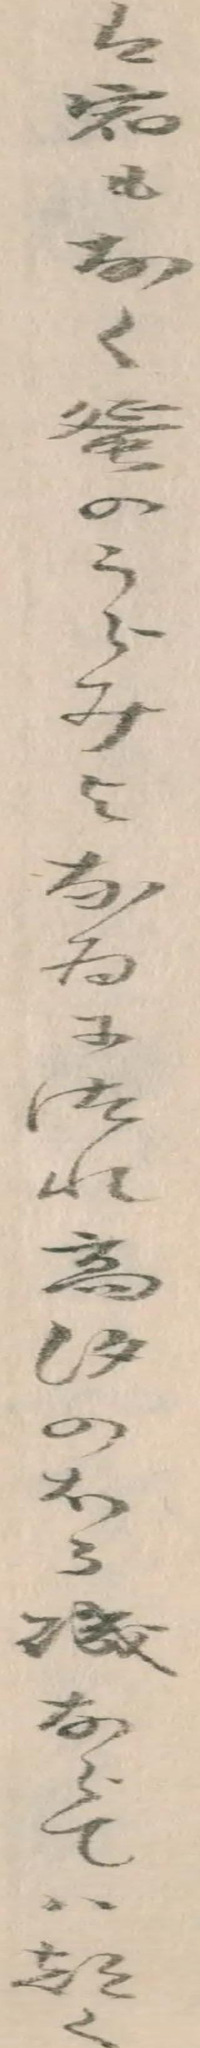は宿もなく蜑のうらみよなゐにつれ高汐のほる磯ならては乾く
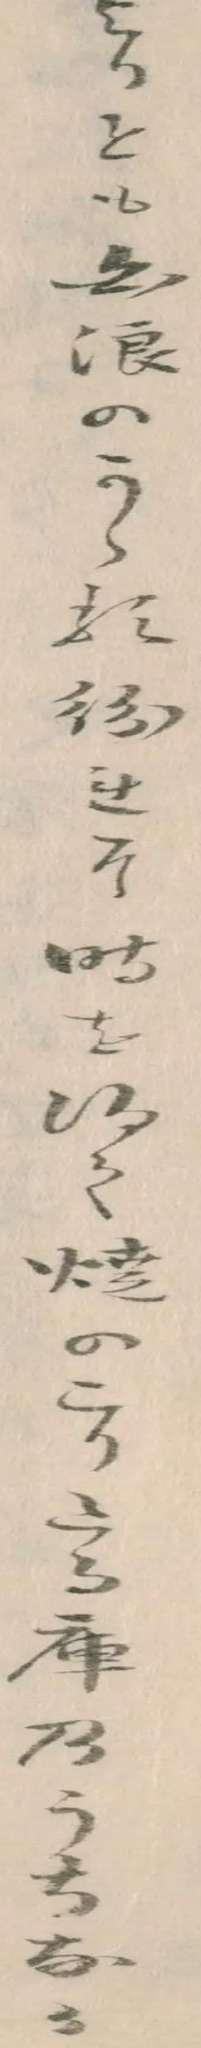よりとも白浪のかゝる紛れに時を得て焼のこりたる庫のうちなか
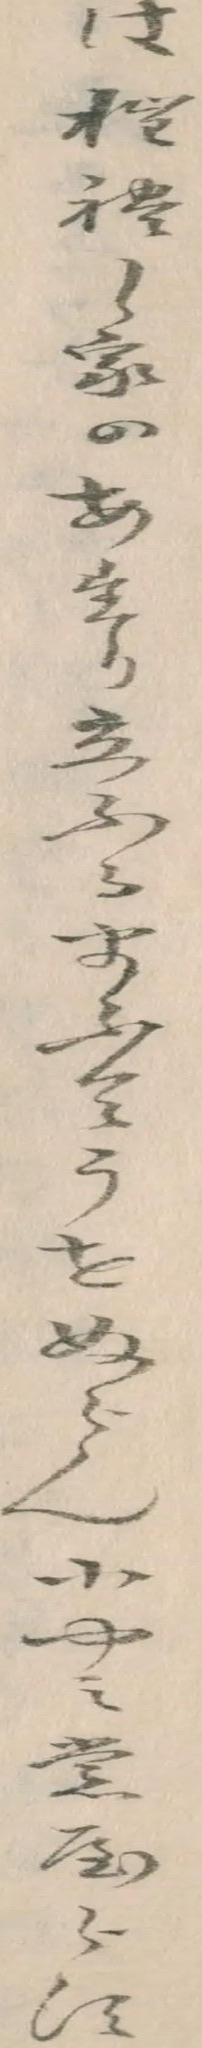は摧れし家のあたり立ふるまふてうせぬらん小やみもやらす
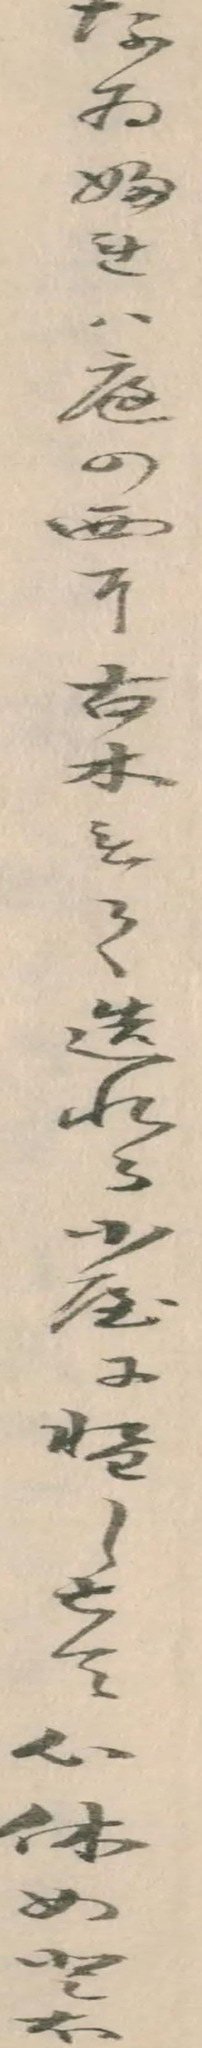なゐふれは庭の西に古木もて造れる小屋に暫しとて心休めとほ

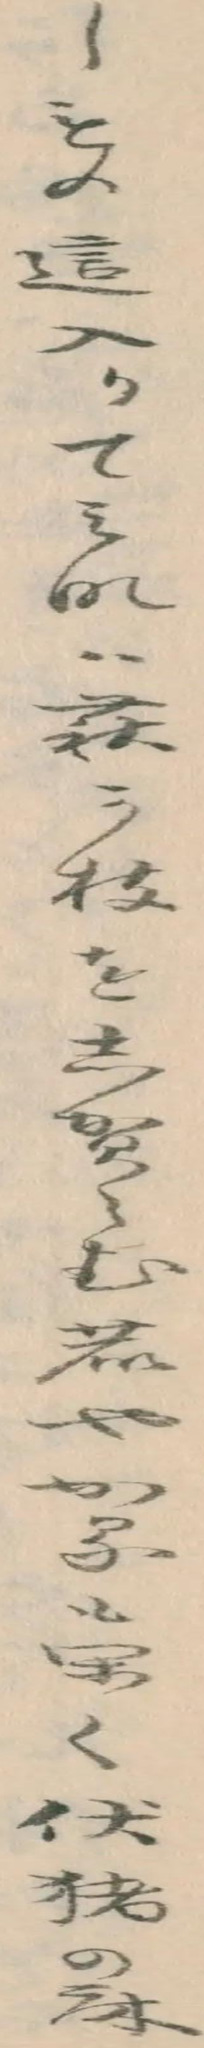しもの這入りてみなは萩か枝をしからむ赫やかるもかく伏猪の床
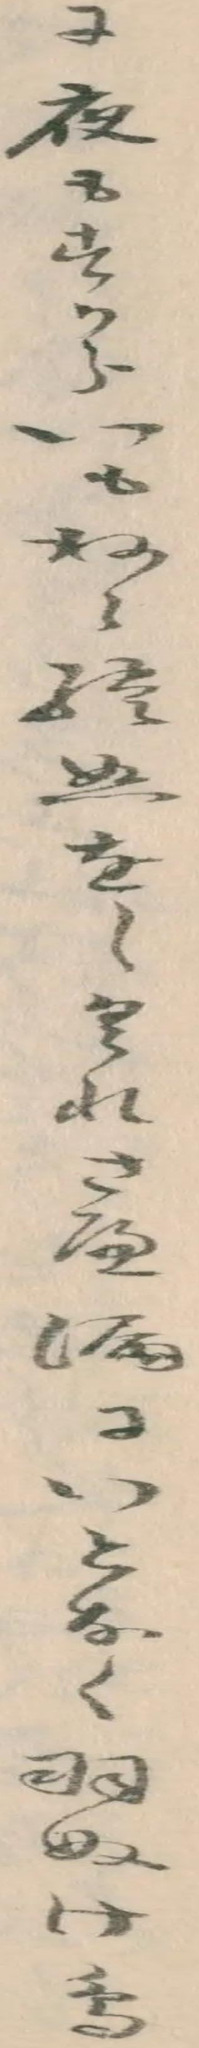に夜もすからいもねられぬをしくれさへ漏にいとなく羽ぬけ鳥
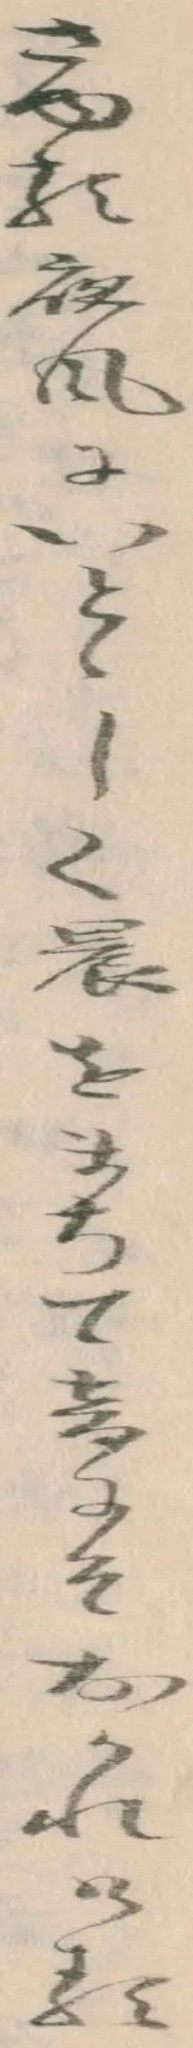さゆる夜風にいとゝしく晨をまちてねにそなかれける
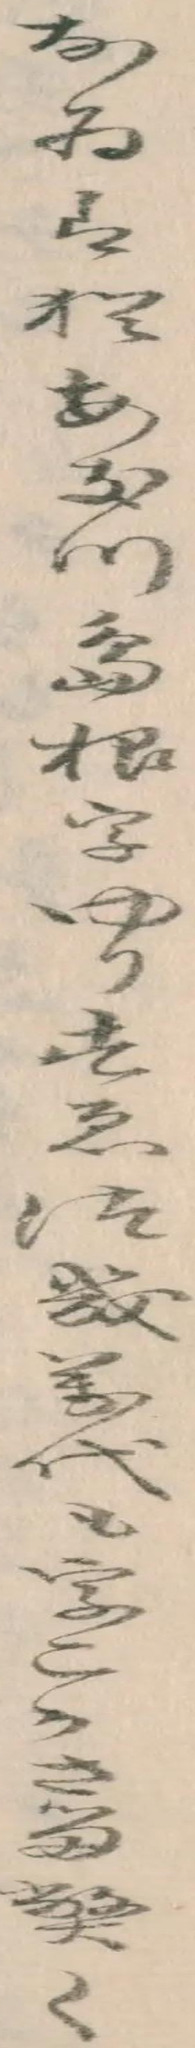なゐは猶あきつ島根宇ゆりすゑつ幾万代も宇こかさるへく
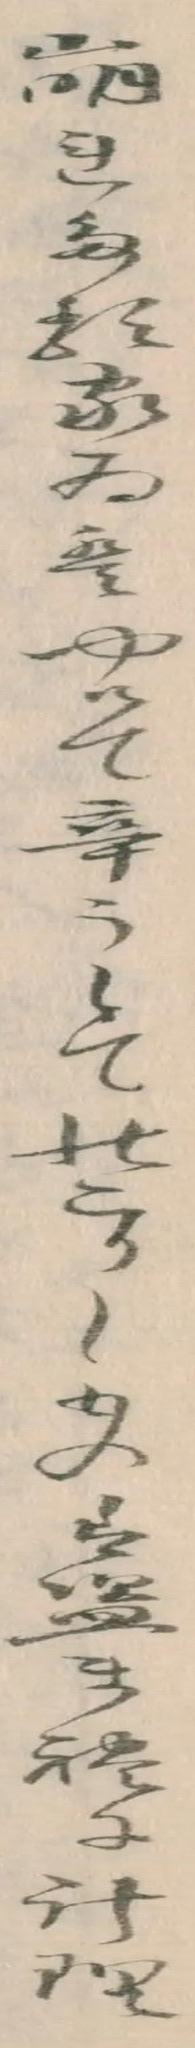崩れたる家ゐとやけて辛うしてのこりしものは盗まれにけり
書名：地災撮要. 巻10(地震之部) 上,下
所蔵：国立国会図書館 National Diet Library, JAPAN
